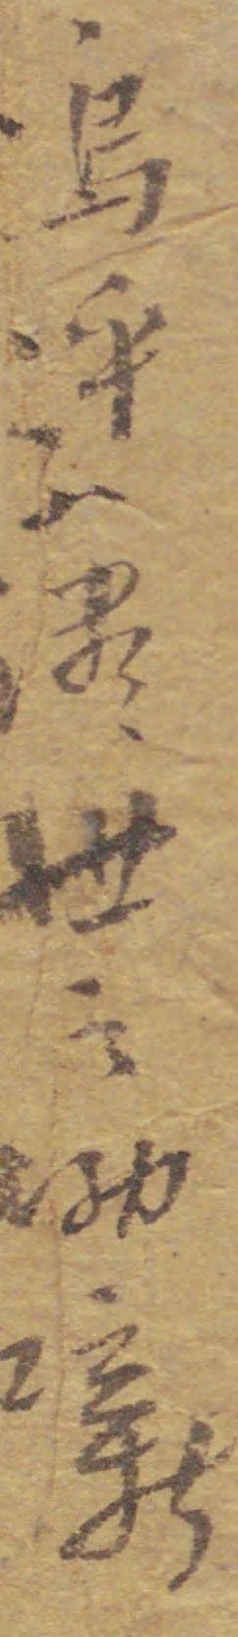嗚呼不侭世之助噺

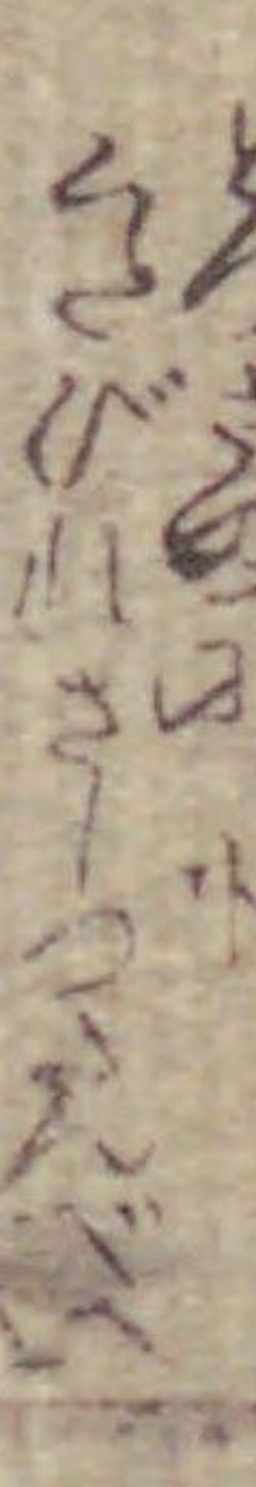くたびれさしつたんべい
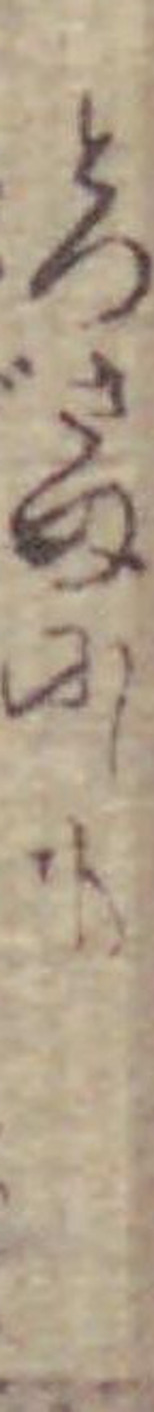とつさまにしも
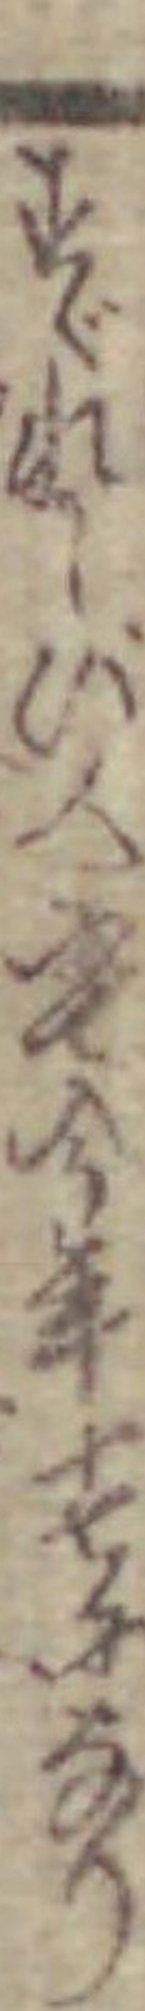すぐれしび人にて今年十七になり
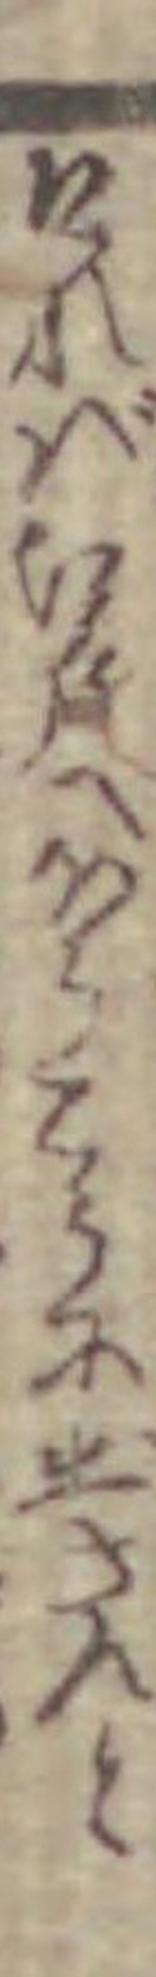ければ江戸へほうこうに出さんと
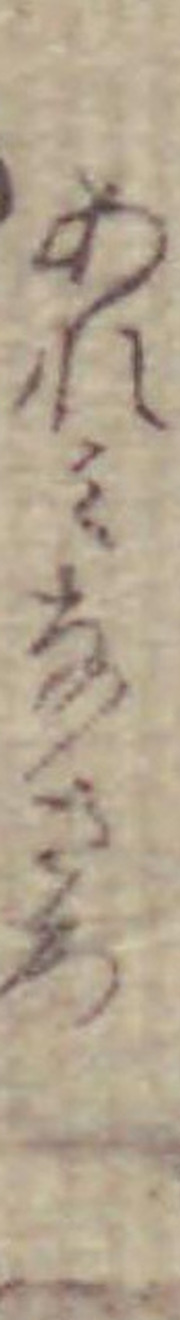あれみなさろ
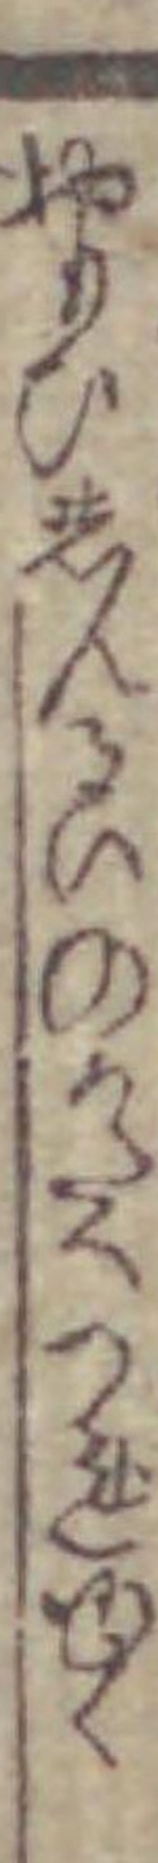おもひしんるいのかたへつれゆく
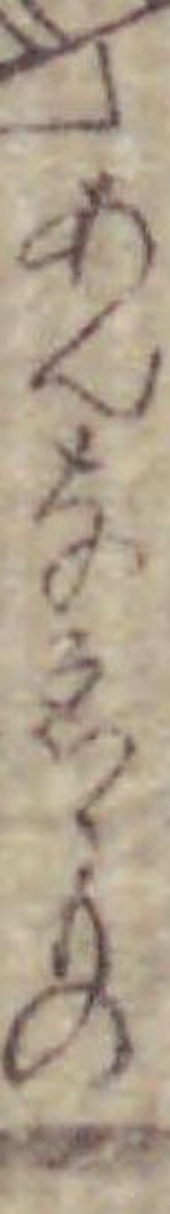あんなゑゝもの
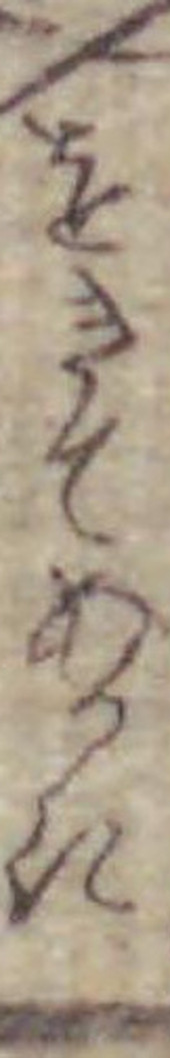をきてあるき
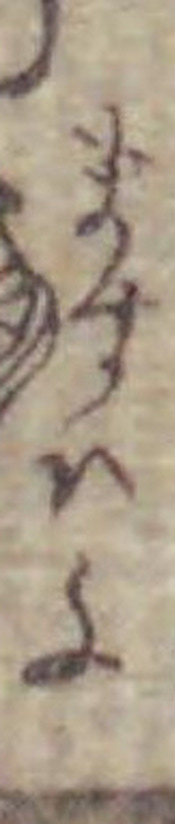ますはよ
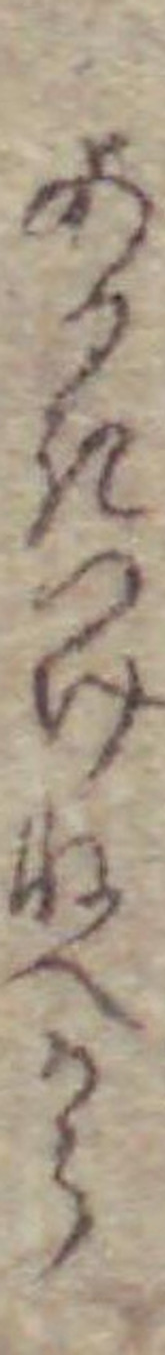あるきつけねへから
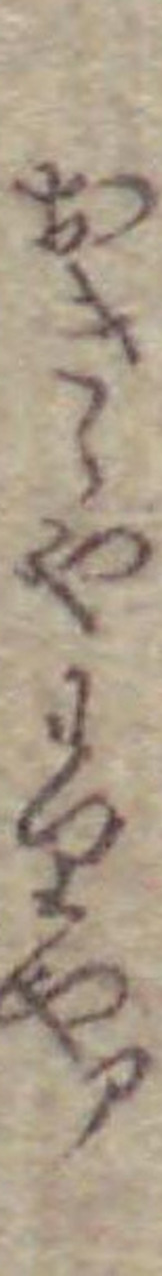おきくやわりやア
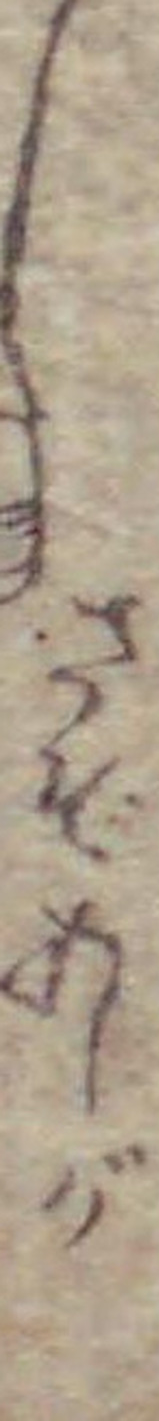さぞあしが
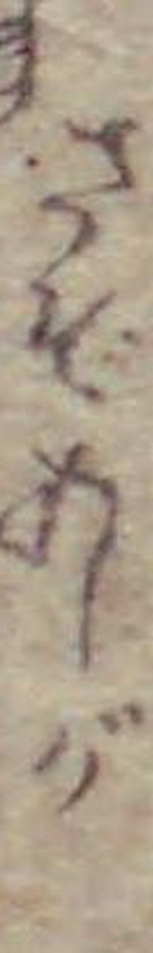さぞあしが
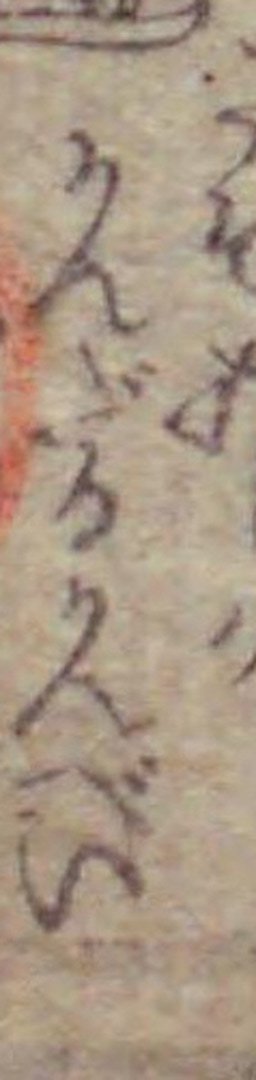かんだるかんべい

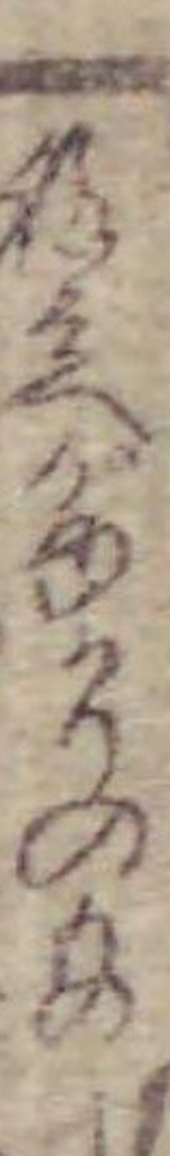福兵へがゆかりのもの
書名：嗚呼不侭世之助噺 : 3巻
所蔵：国立国会図書館 National Diet Library, JAPAN
